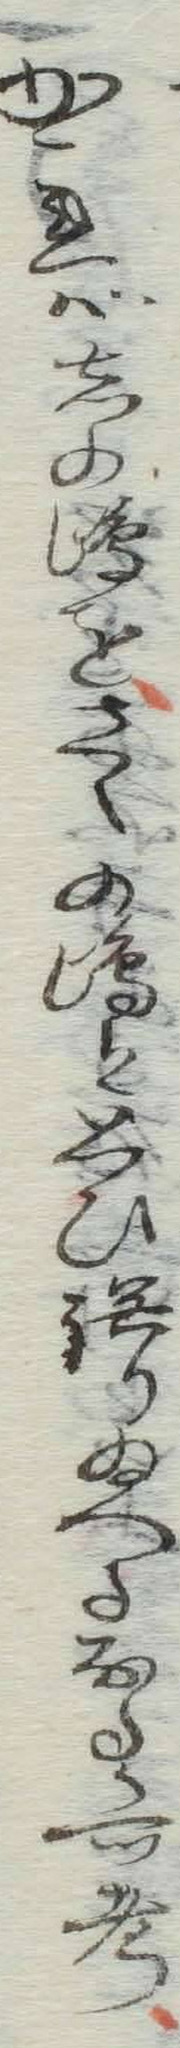かゝればしの嶋を、さくの嶋と思ひ誤り給へるなるか可考、
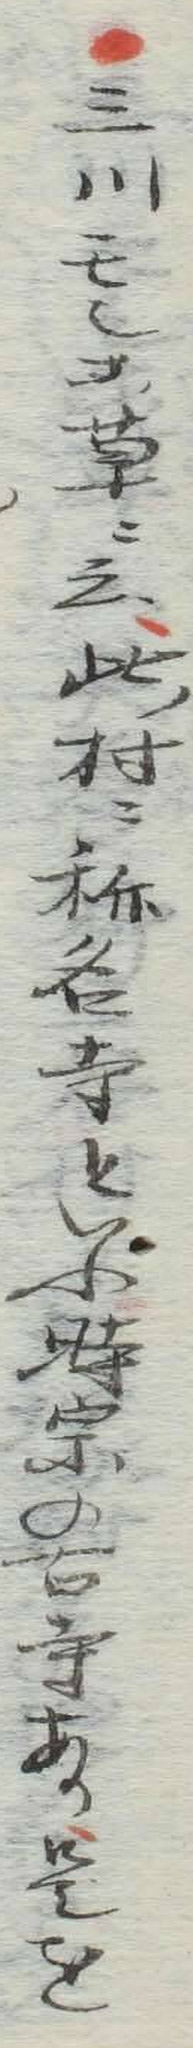●三川モシホ草ニ云、此村ニ称名寺といふ時宗の古寺あり、是を
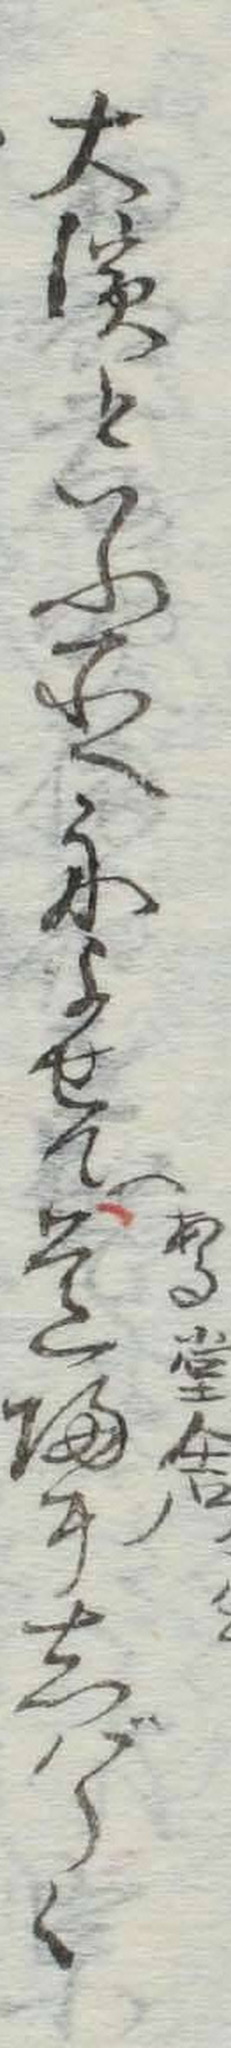大濱といふ所へ舟よせて、道場にしばらく
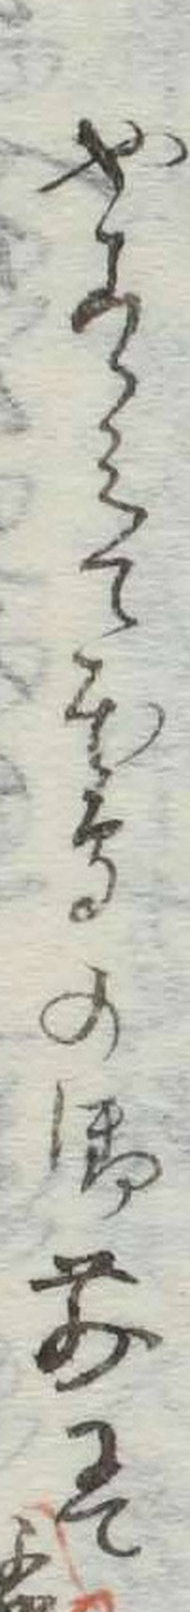やすみて本尊の御前にて｡
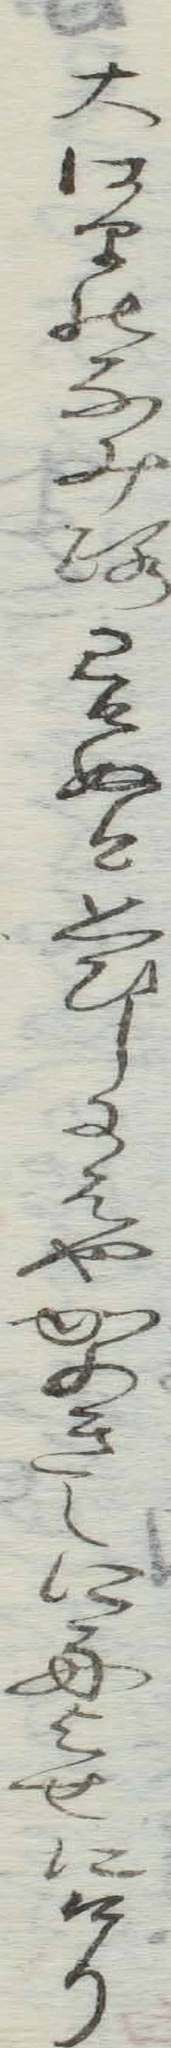大はまのなみ路わけぬと思ひしにはやかのきしに舟よせにけりモ
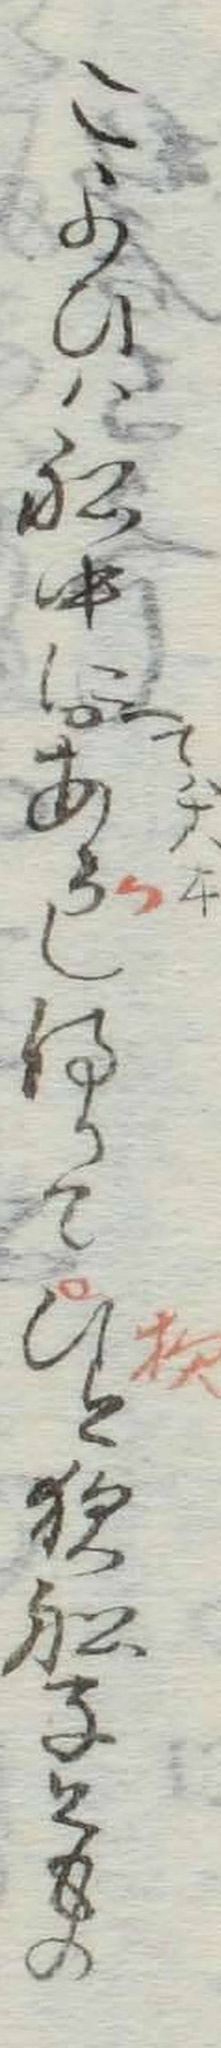こよひは船中に｡あかし侍りて｡ひと夜船子ともの
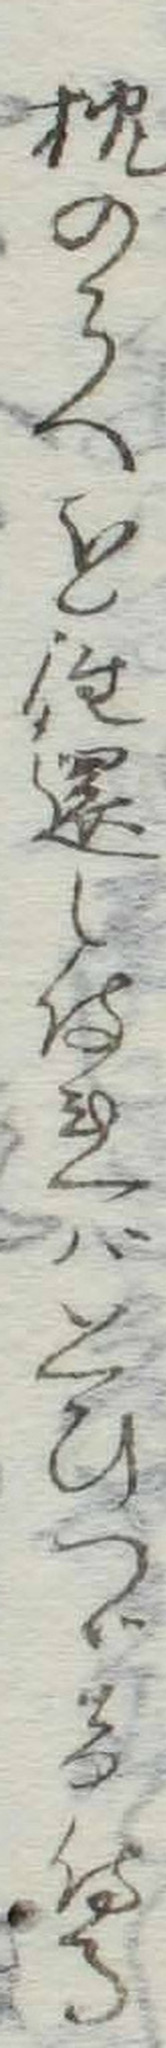枕のうへを往還し侍れば思ひつゞけ侍る
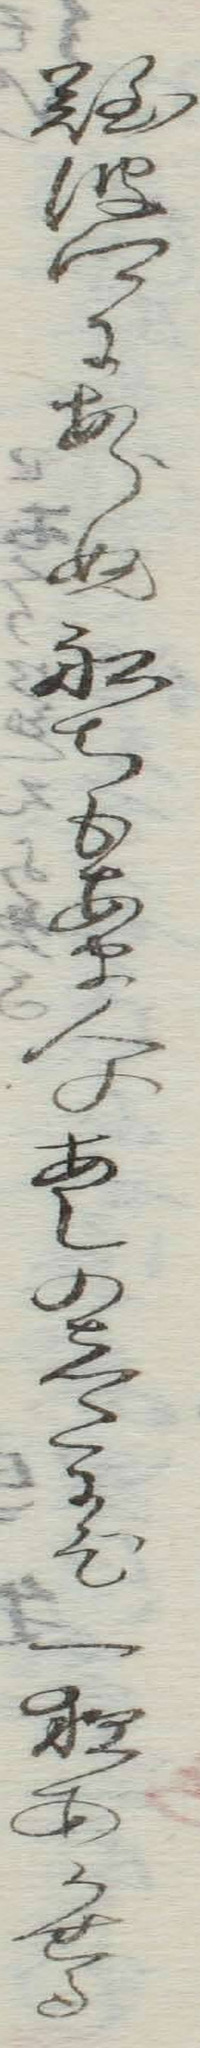難波江にあらぬ船ちもあま人のあしのしたにぞ一夜あかせる
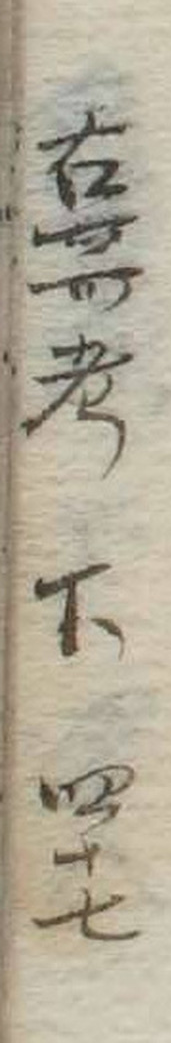古歌考下四十七

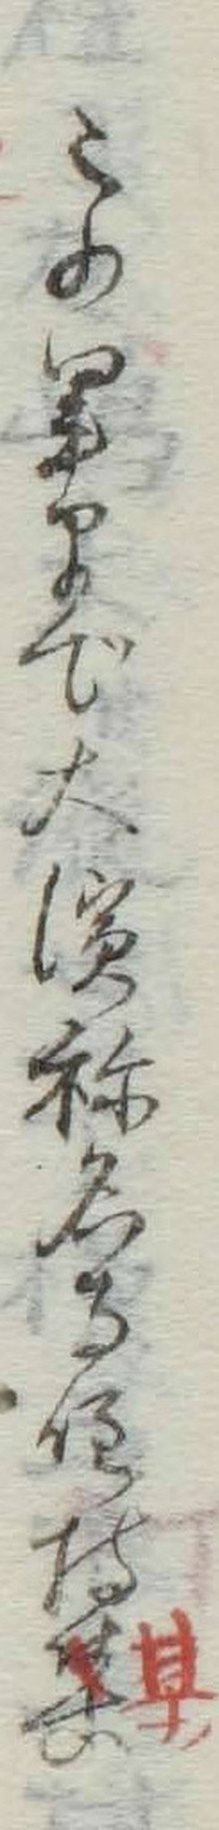この里まで大濱称名寺住持某
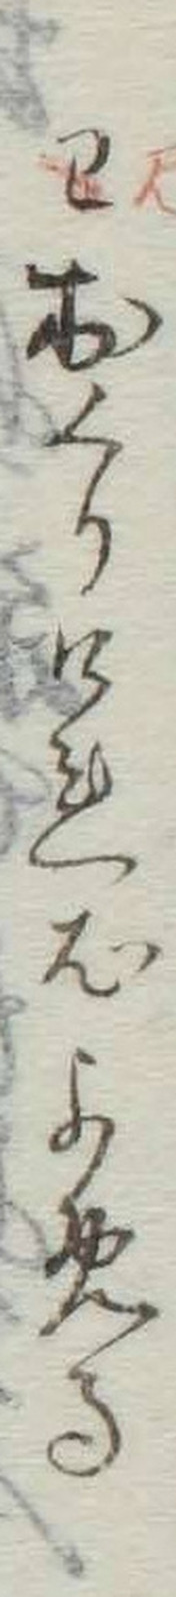見おくりければよめる
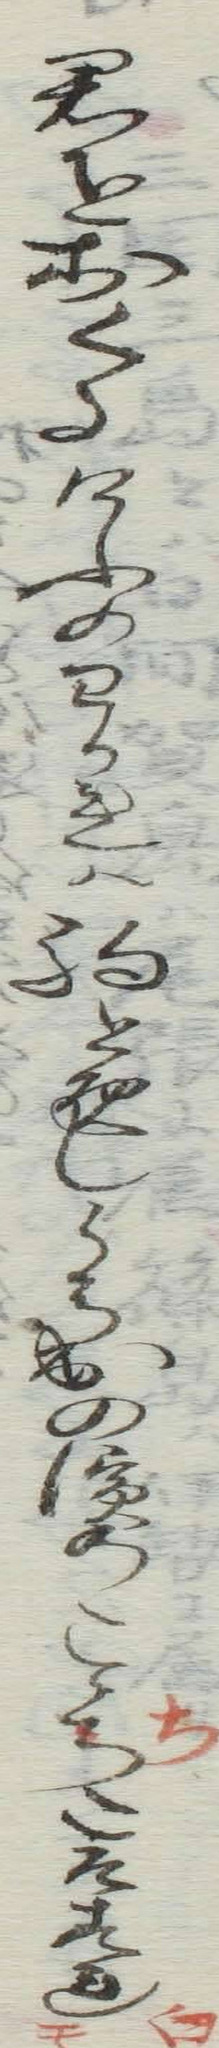君をおくるけふのわかれは駒とめしうち出の浜のこゝちこそすれ白モ
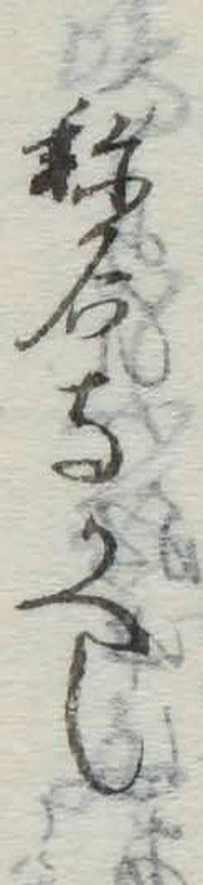称名寺かへし
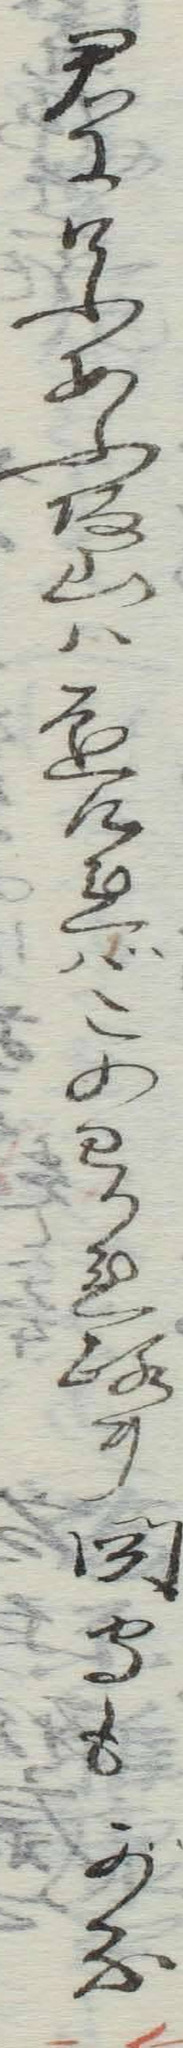君にけふあふ坂山は遠ければこのわかれ路に関守もがな白モ
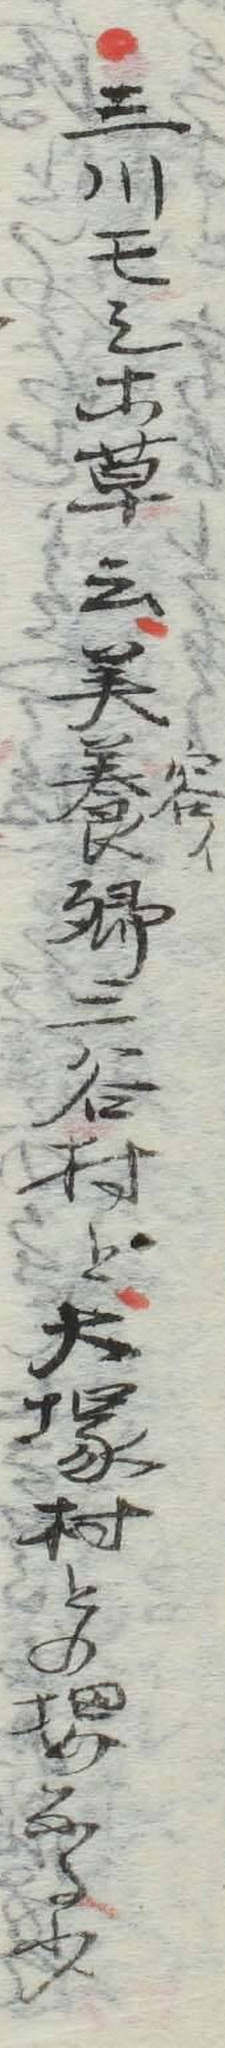●三川モシホ草云、美養郷三谷村と、大塚村との堺なる少
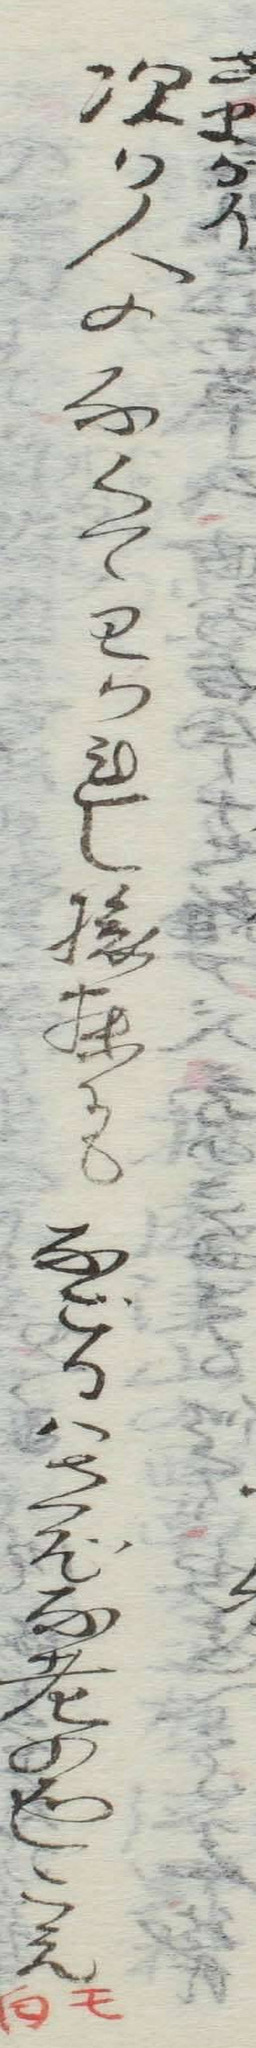次か人のなくてわかれし旅寝にもなごりはさぞな老のほしこえモ白
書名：三河国古跡考
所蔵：国文学研究資料館
